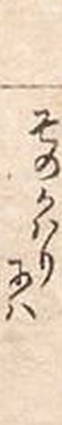そのかはりには
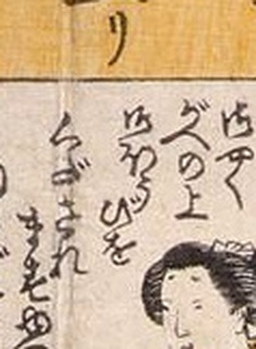御ほうびを
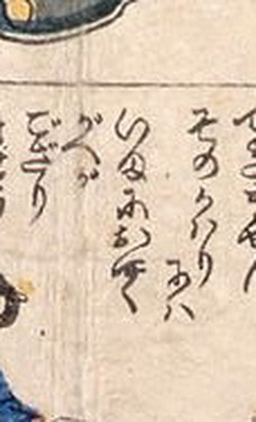いまにおやく
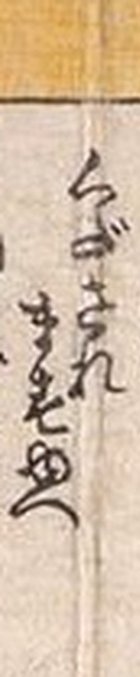くだされ
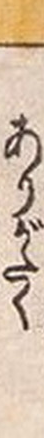ありがたく
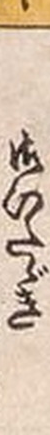御いたヾき
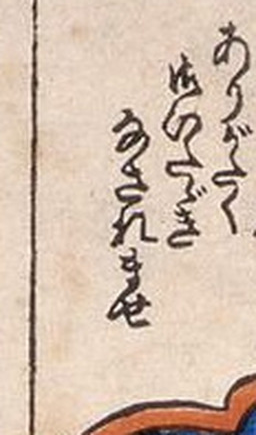なされませ
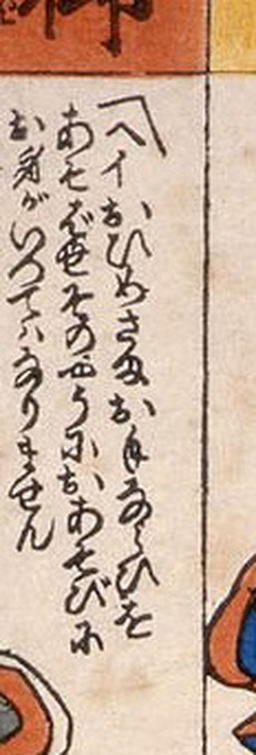〽ヘイおひめさまお手ならひを
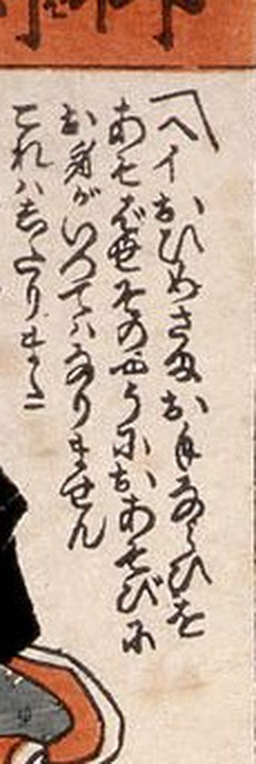あそばせそのやうにおあそびに
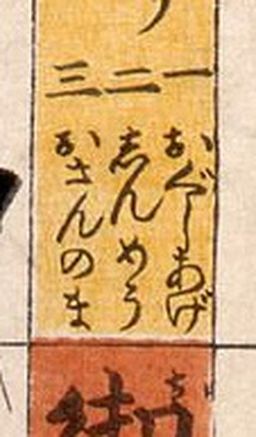五しんめう
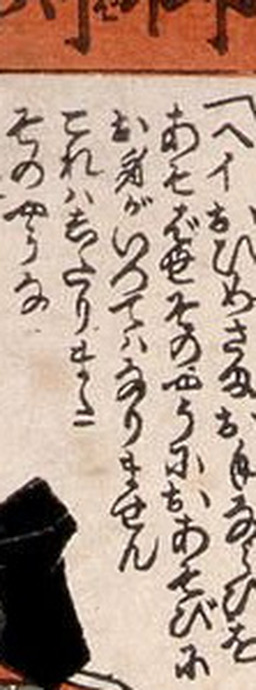お身がいつてはなりません
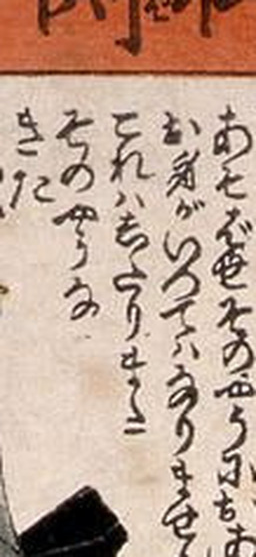これはしたりまた
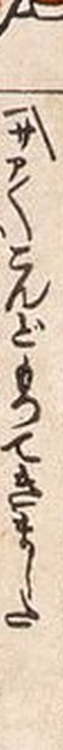〽サア〳〵こんどもつてきました
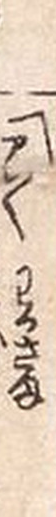〽アレ〳〵わかさま
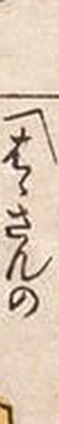〽はゝさんの
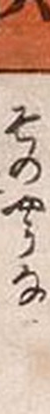そのやうな
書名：奥奉公出世双六
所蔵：東京学芸大学教育コンテンツアーカイブ
